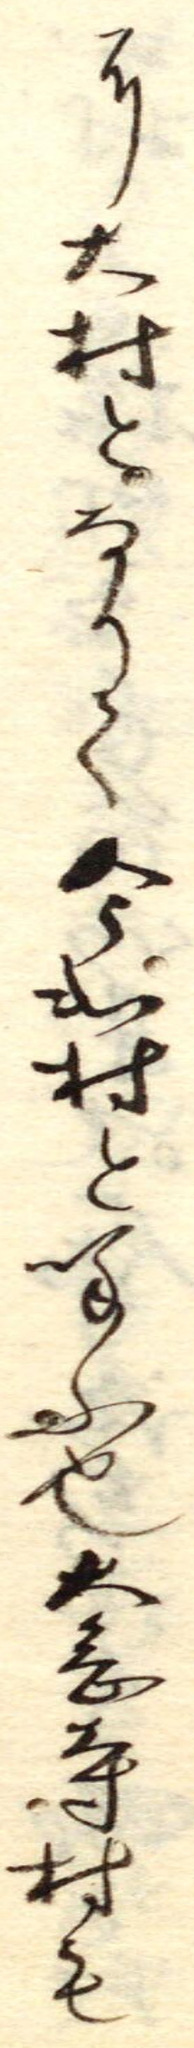に大村となりて今出村と呼ふ也大念寺村も
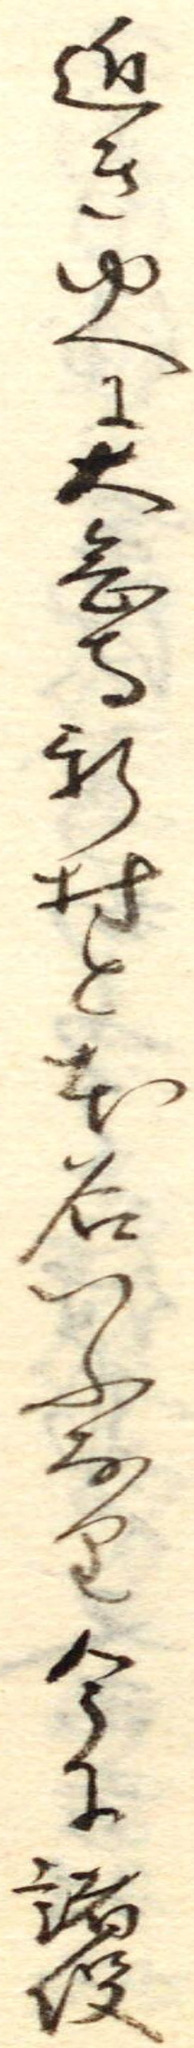近きゆへに大念寺新村と本名いふなり今に諸役
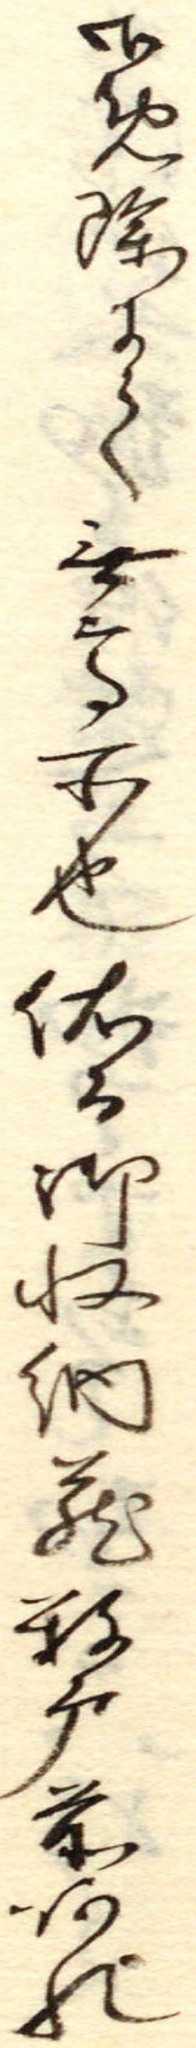御免除にて無高所也依而御収納蔵数戸前あれ
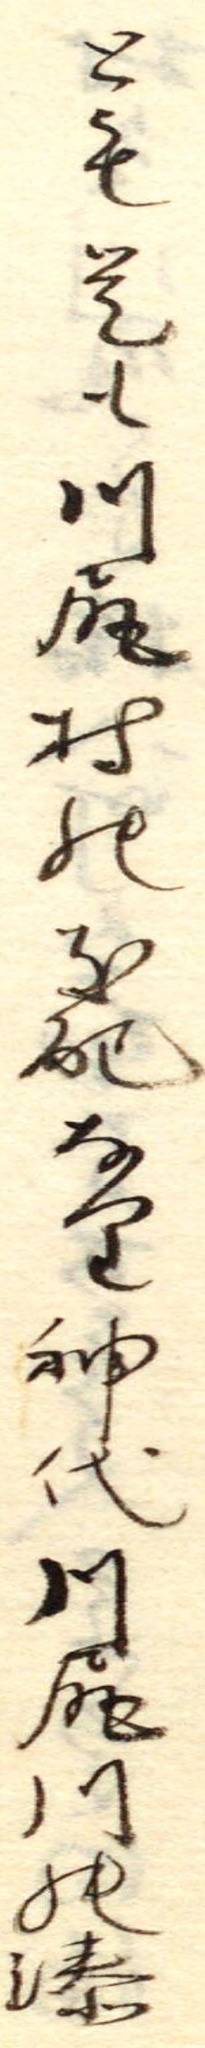とも是も川尻村の支配なり神代川尻川の湊
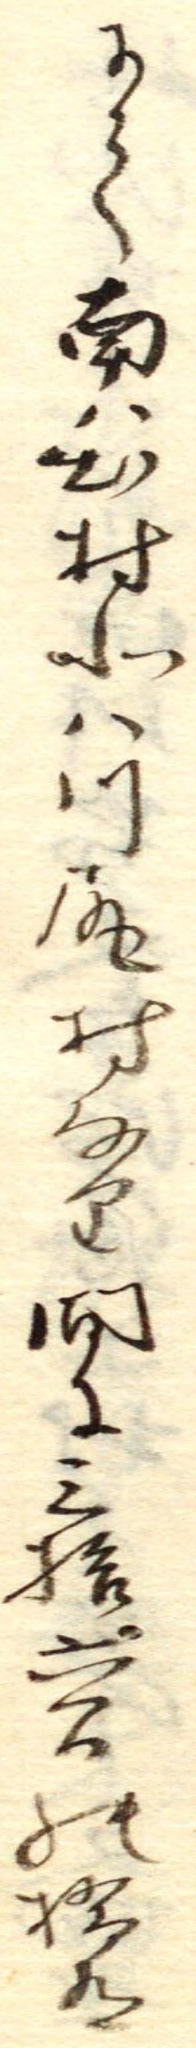にて南は出村北は川尻村なり間に三拾六間の橋有
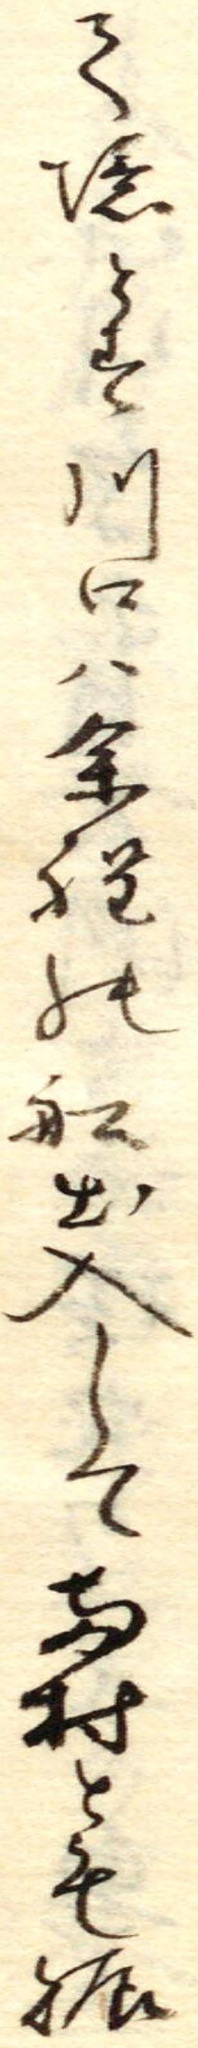て境とす川口は余程の船出入して両村とも賑
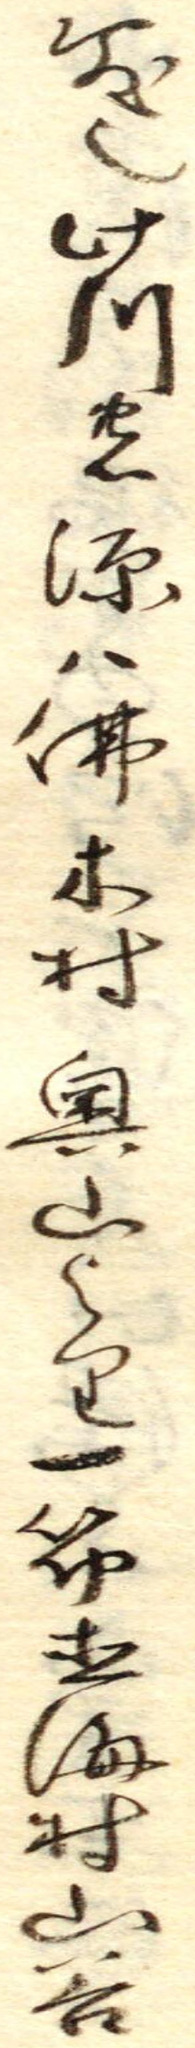敷也此川の源は仏木村奥山より一筋直海村山谷

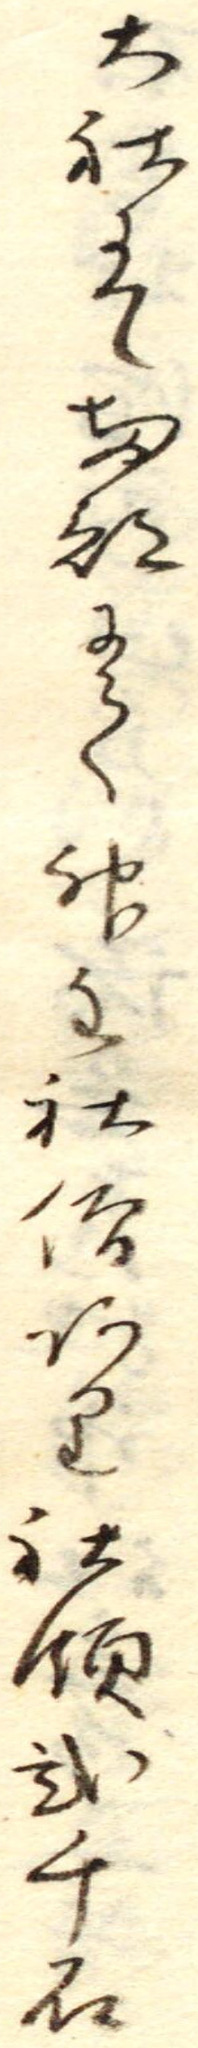大社にて両郡にて神主社僧あり社領弐千石
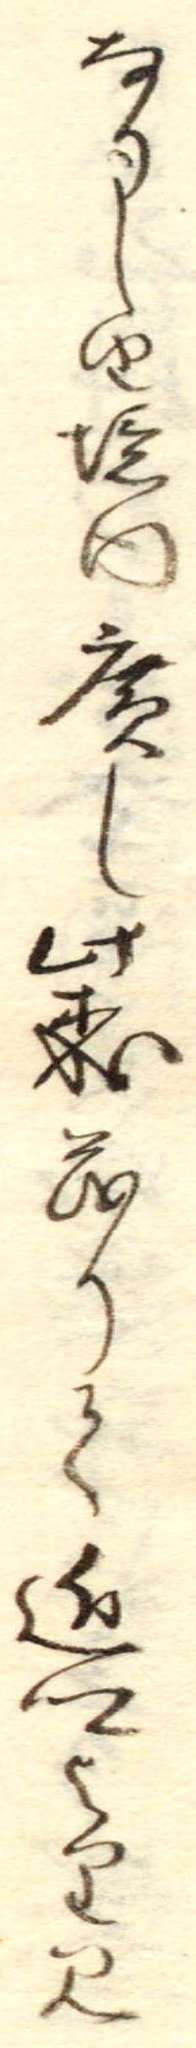なりし由境内広し此森茂りて近郷より見
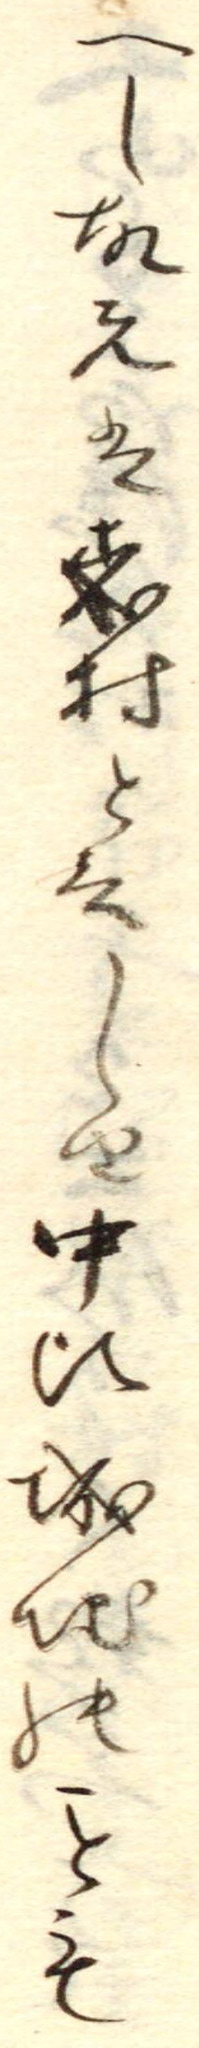へし故先は森村と云し由中比城地のことも
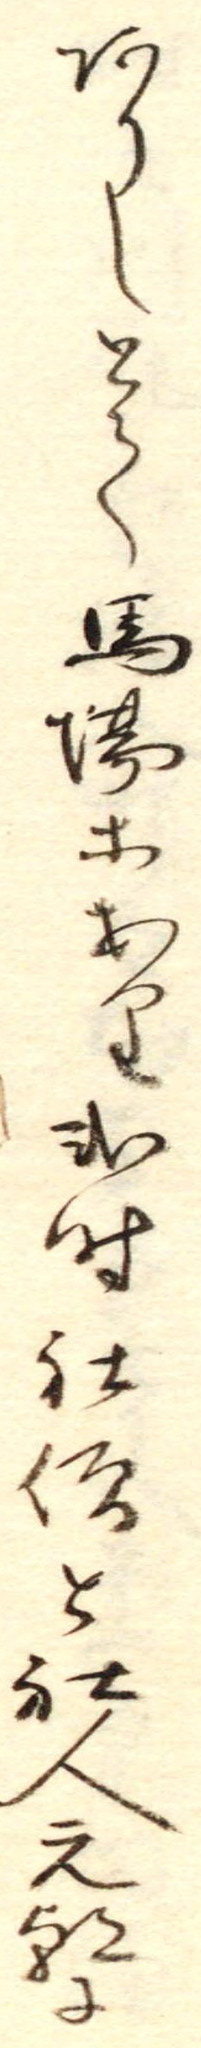ありしとて馬場等あり或時社僧と社人元朝に
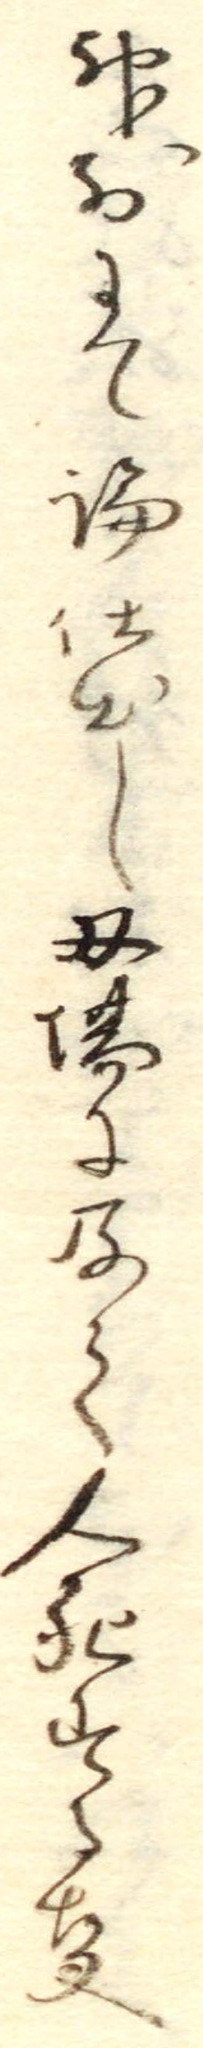神前にて論仕出し刃場に及て人死する事
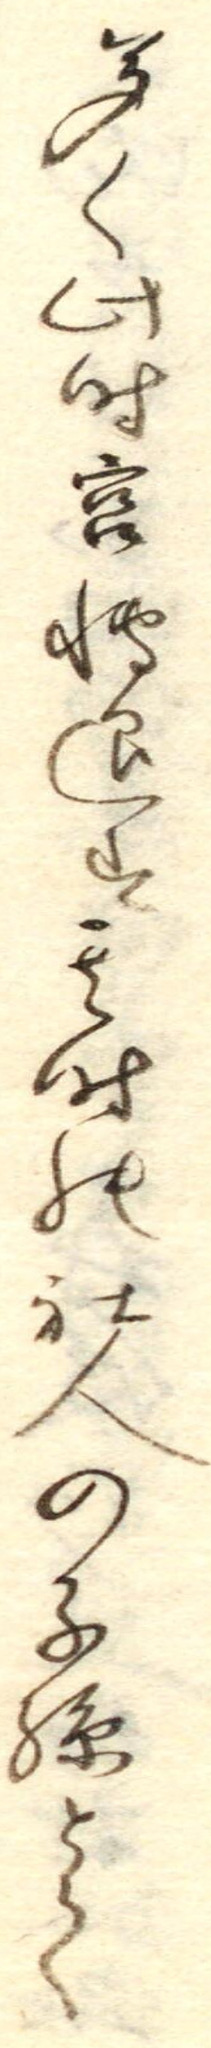多く此時宮転退す其時の社人の子孫とて
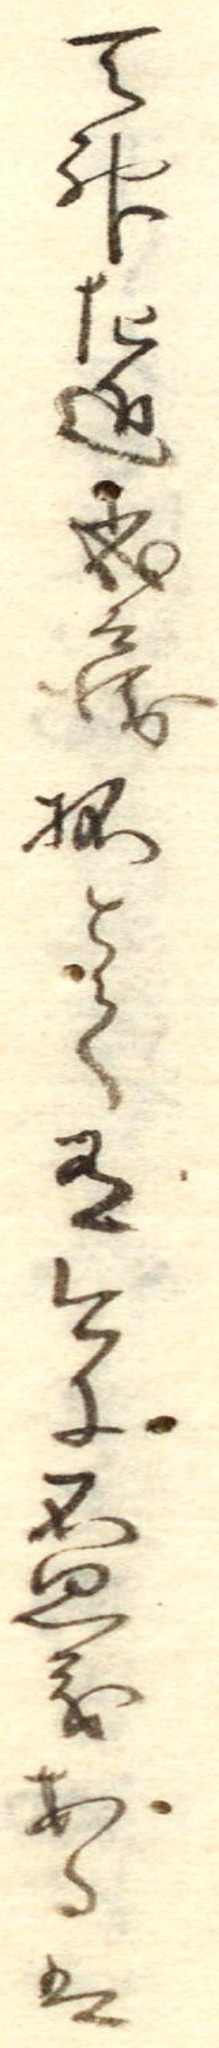天神左近森兵衛抔とて有今に不思義あるは
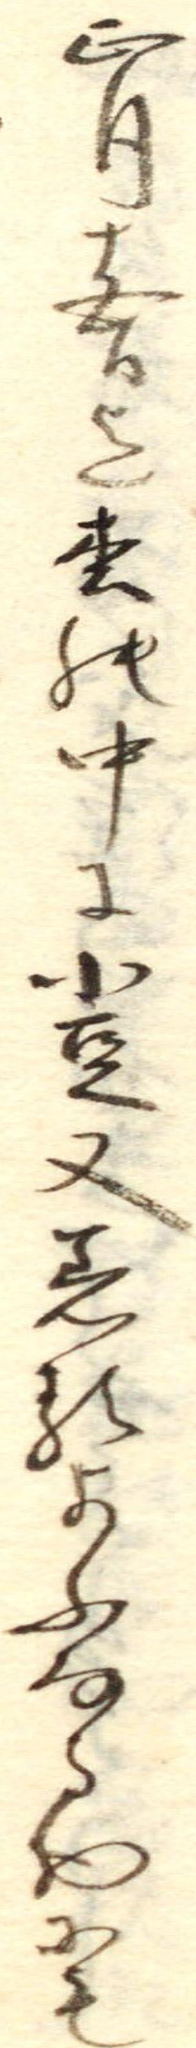正月十五日迄枩の中に小豆又着類よふなる物にも
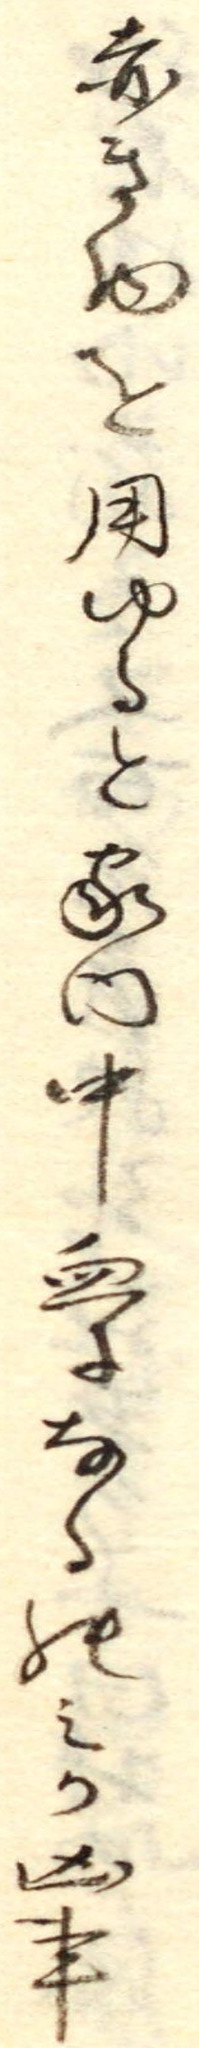赤き物を用ゆると家内中血になるのみか凶事
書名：能登名跡誌
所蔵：Ishikawa Prefectural Library
